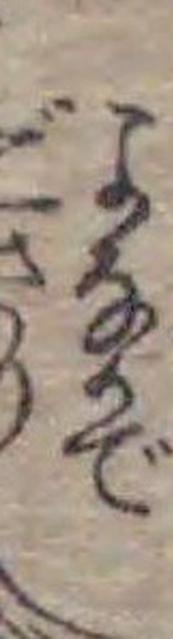よなかで
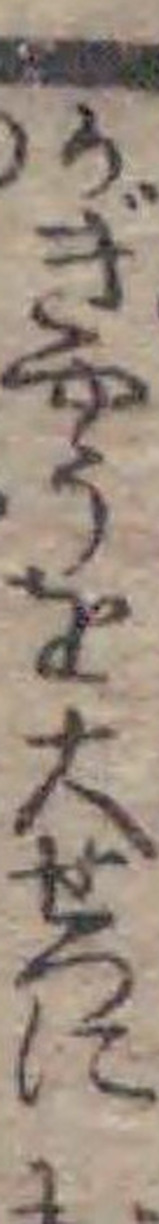かぎやうを大せつに
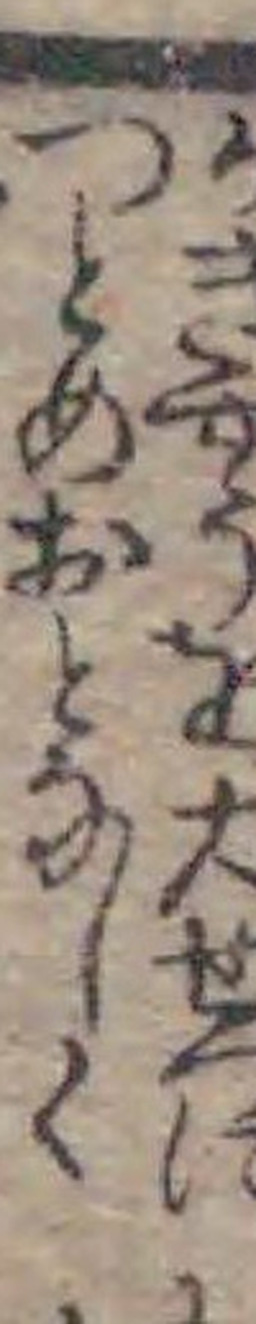つとめおとなしく
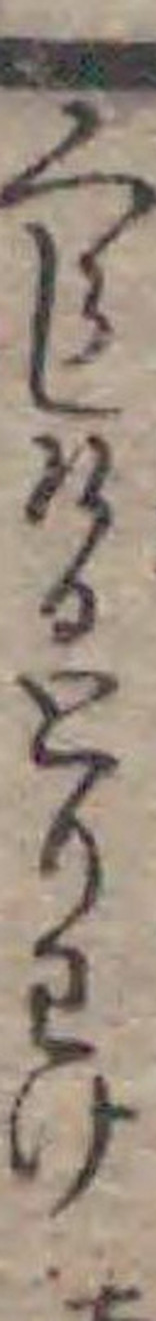くらしけるとりわけ
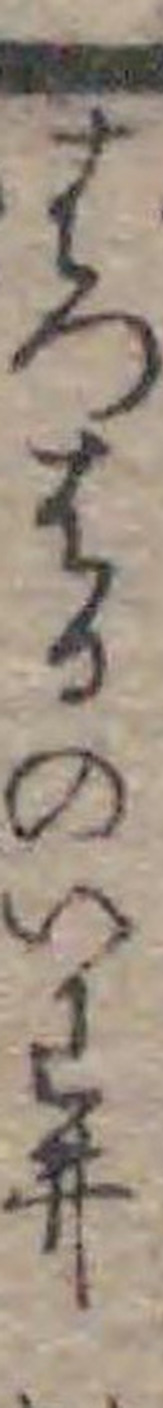はつはるのいわい
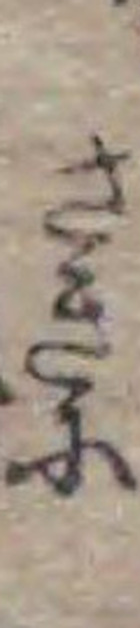さきに
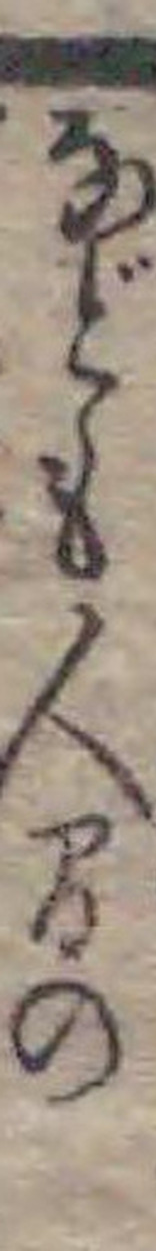なども人間の
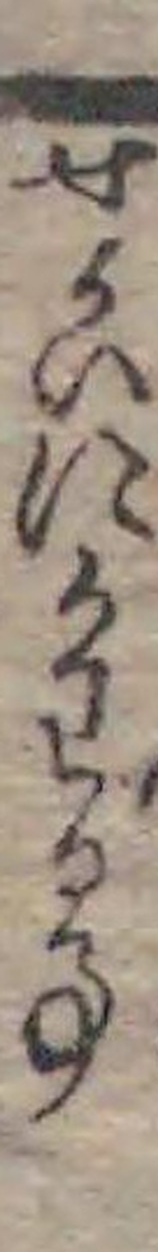せかいにかわる事
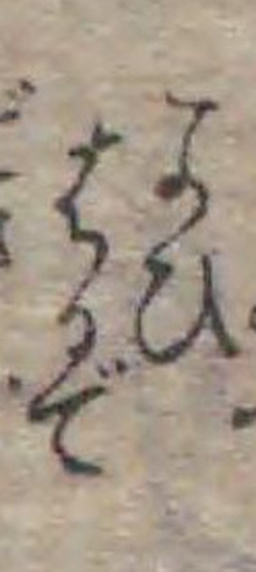はるで
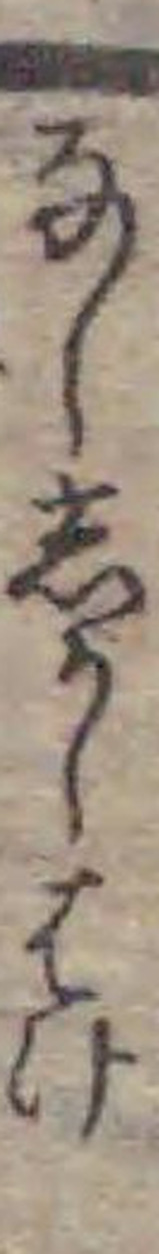なししかしはけ
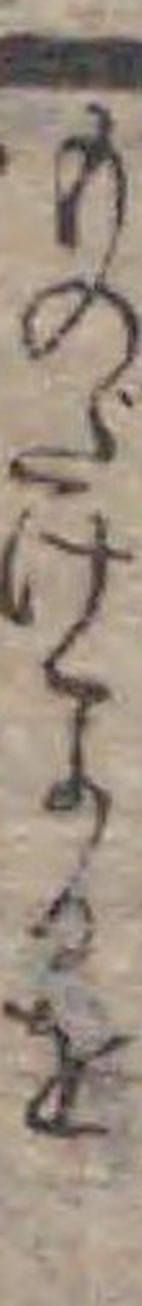ものだけよるを
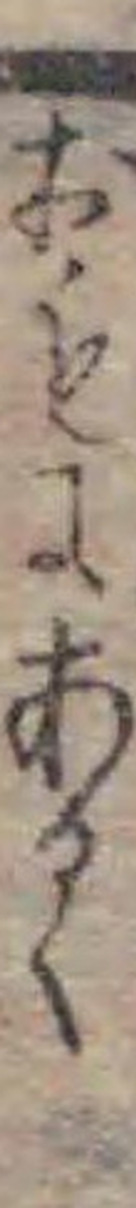おもにあるく
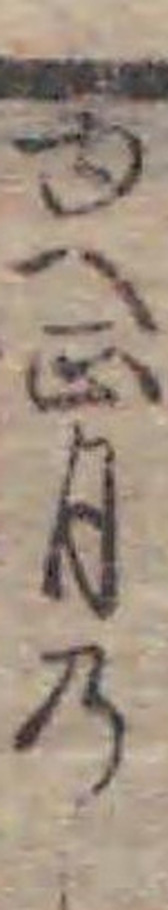ゆへ正月の
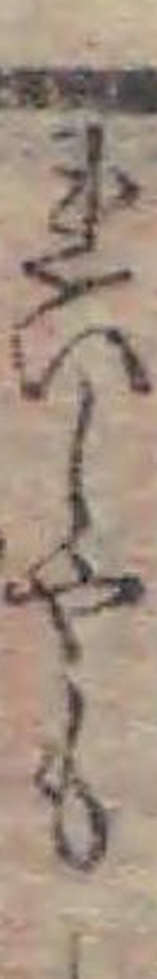れいしやも
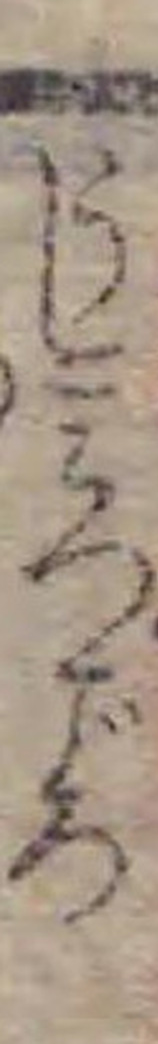うしみつごろ
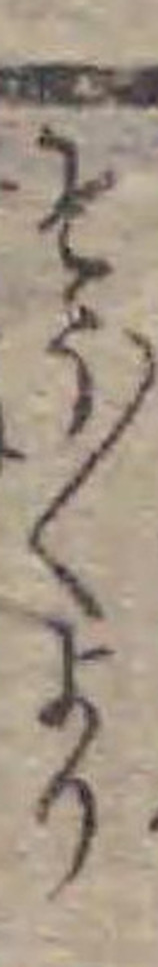そう〳〵より
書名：年中行状記 : 2巻
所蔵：国立国会図書館 National Diet Library, JAPAN
